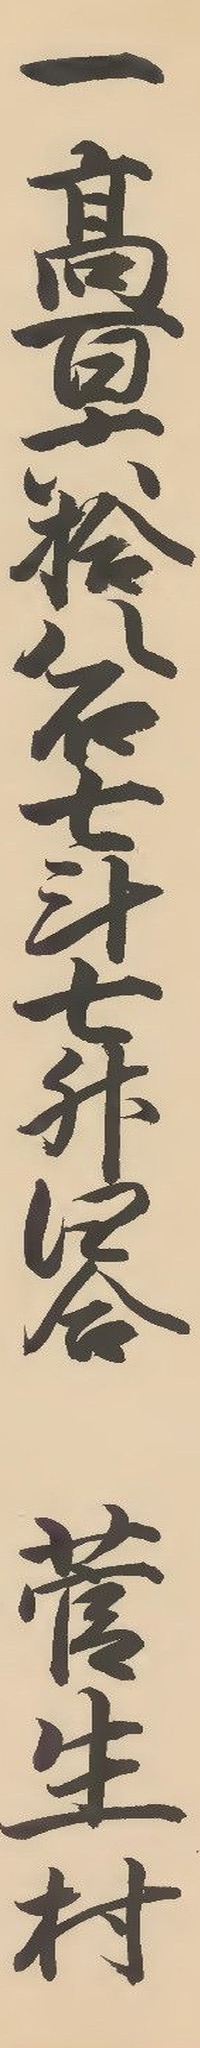一高百六拾八石七斗七升四合菅生村
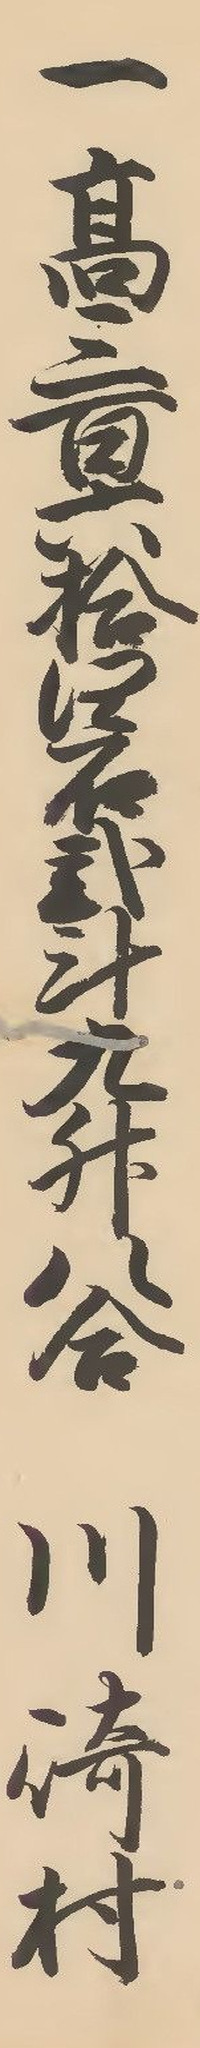一高三百六拾四石弐斗九升八合川崎村

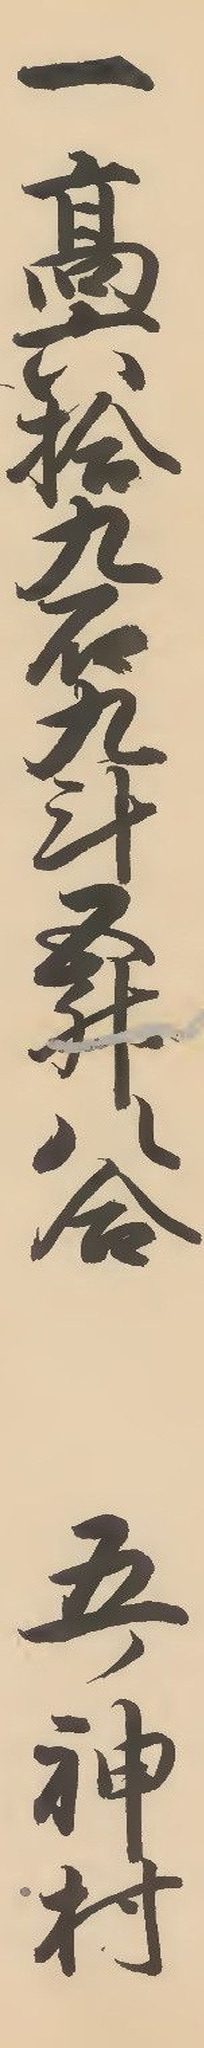一高六拾九石九斗五升八合五ノ神村
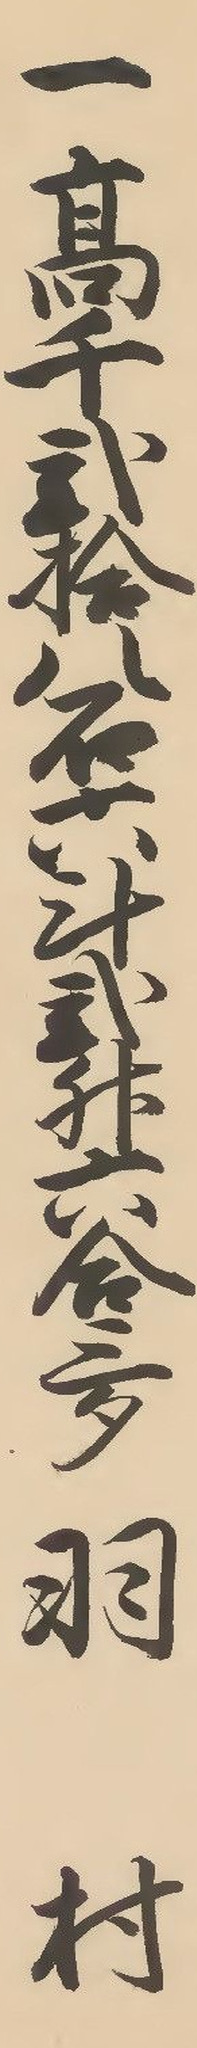一高千弐拾八石六斗弐升六合三勺羽村
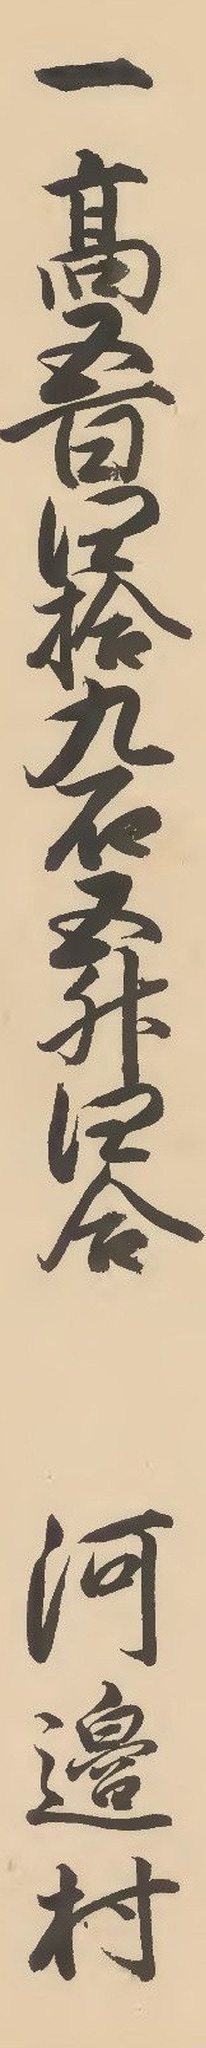一高五百四拾九石五升四合河邉村
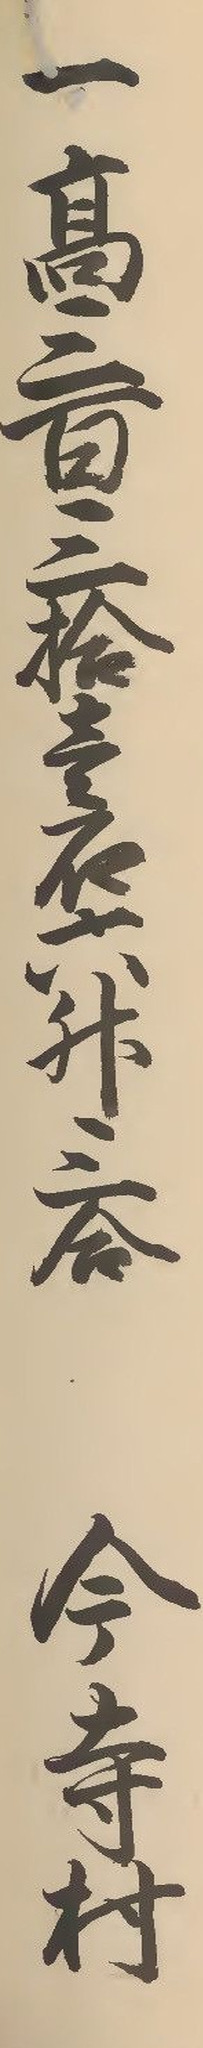一高三百三拾壱石六升三合今寺村
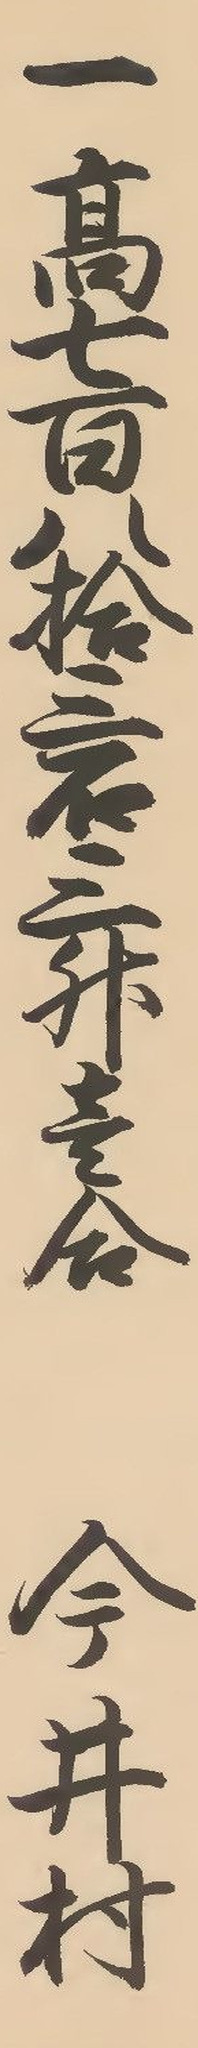一高七百八拾三石三升壱合今井村
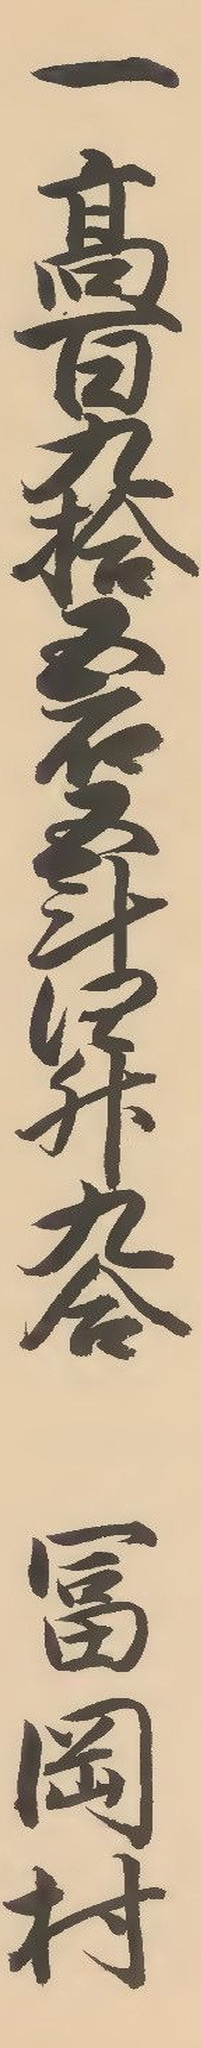一高百九拾五石五斗四升九合冨岡村
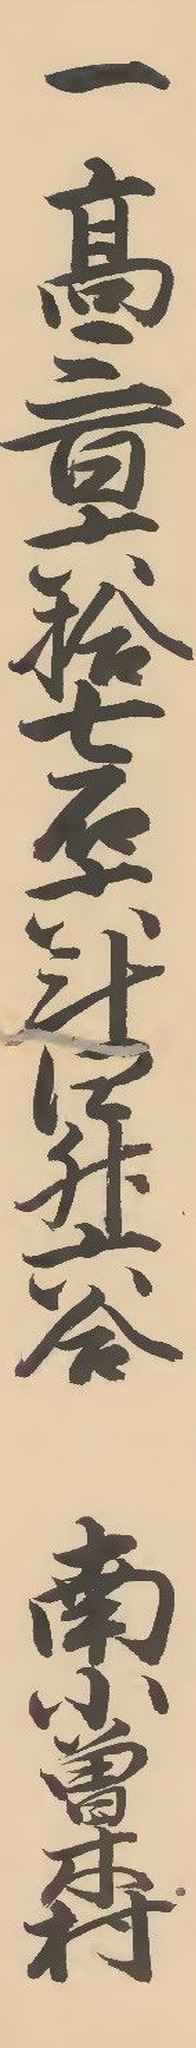一高三百六拾七石六斗四升六合南小曽木村

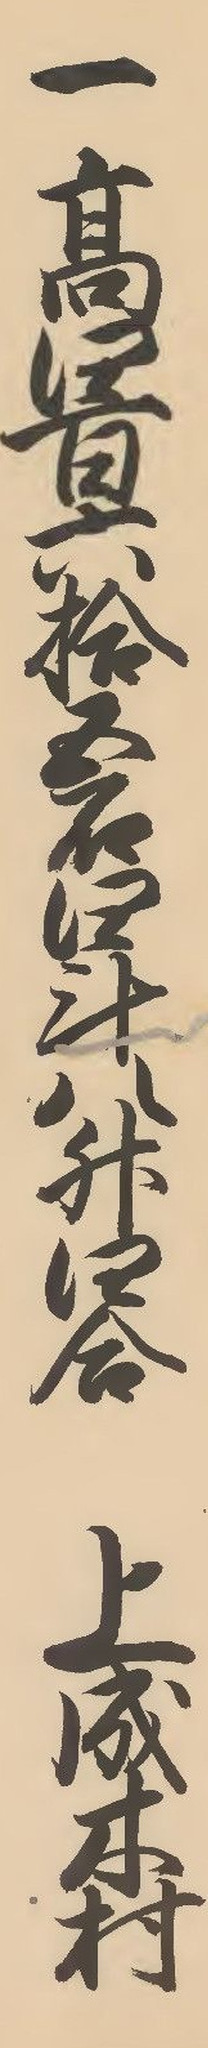一高四百六拾五石四斗八升四合上成木村
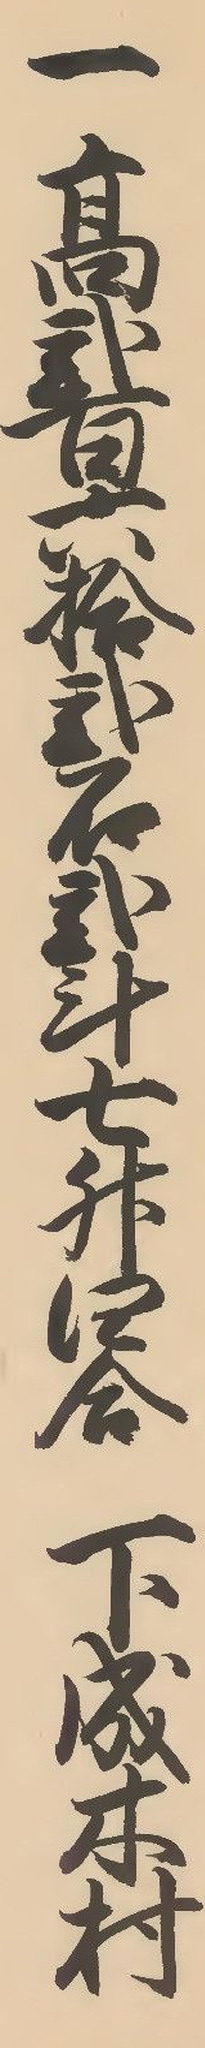一高弐百六拾弐石弐斗七升四合下成木村
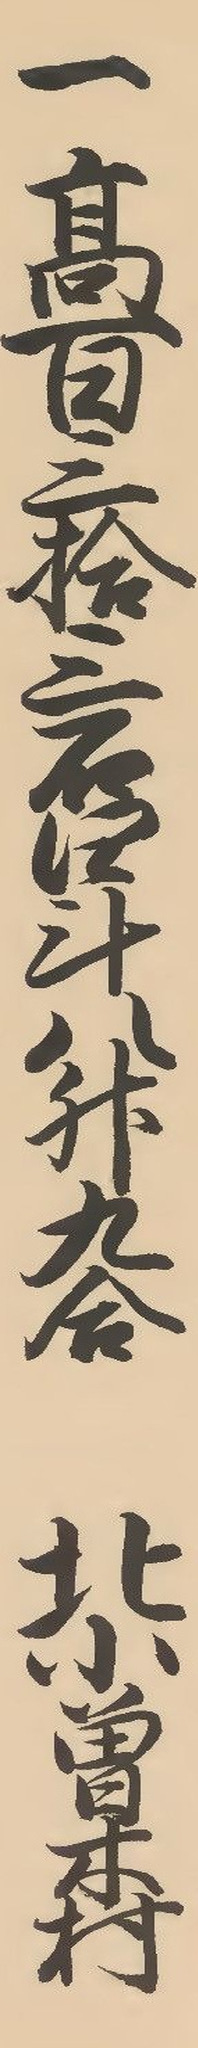一高百三拾三石四斗八升九合北小曽木村
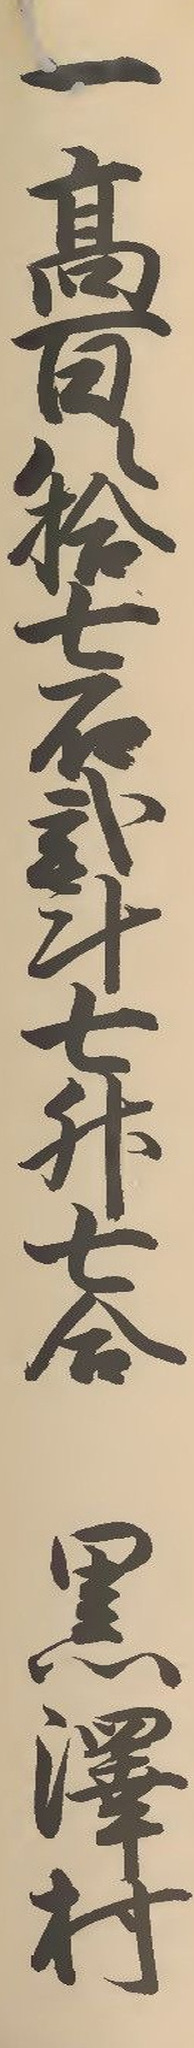一高百八拾七石弐斗七升七合黒澤村
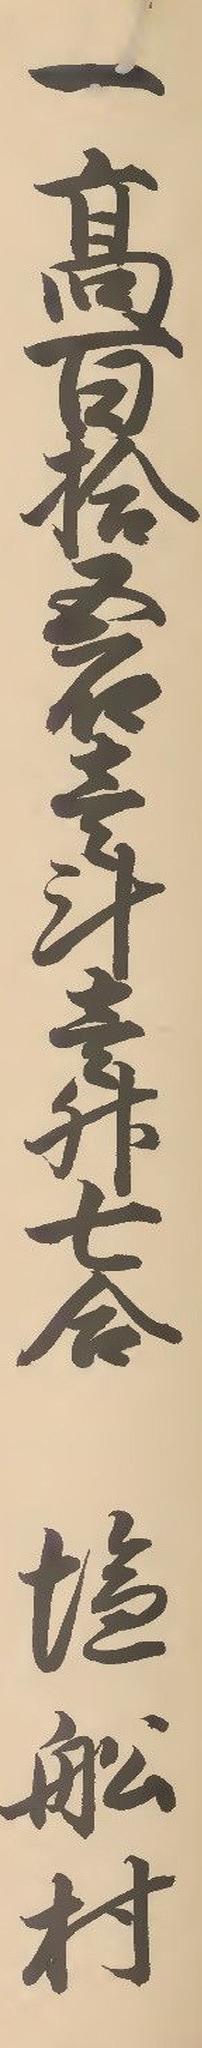一高百拾五石壱斗壱升七合塩船村
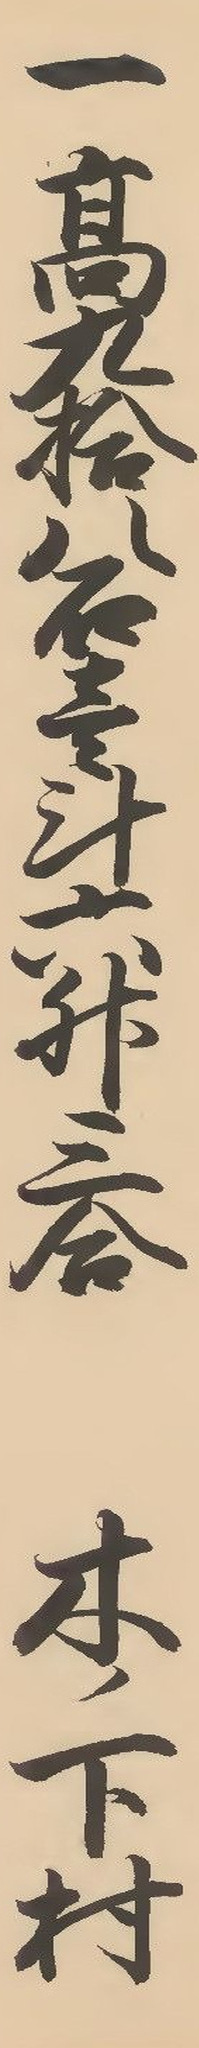一高九拾八石壱斗六升三合木ノ下村
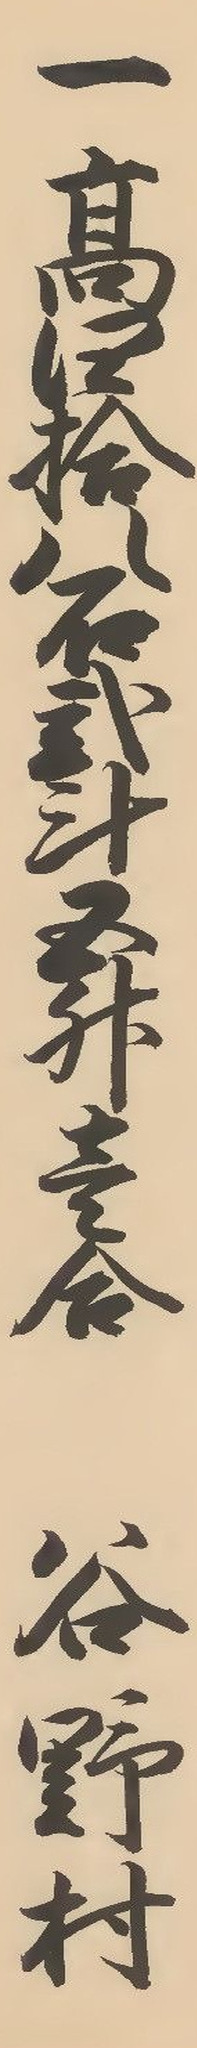一高四拾八石弐斗五升壱合谷野村
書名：武蔵国郷帳　上
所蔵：国立公文書館 National Archives of Japan
